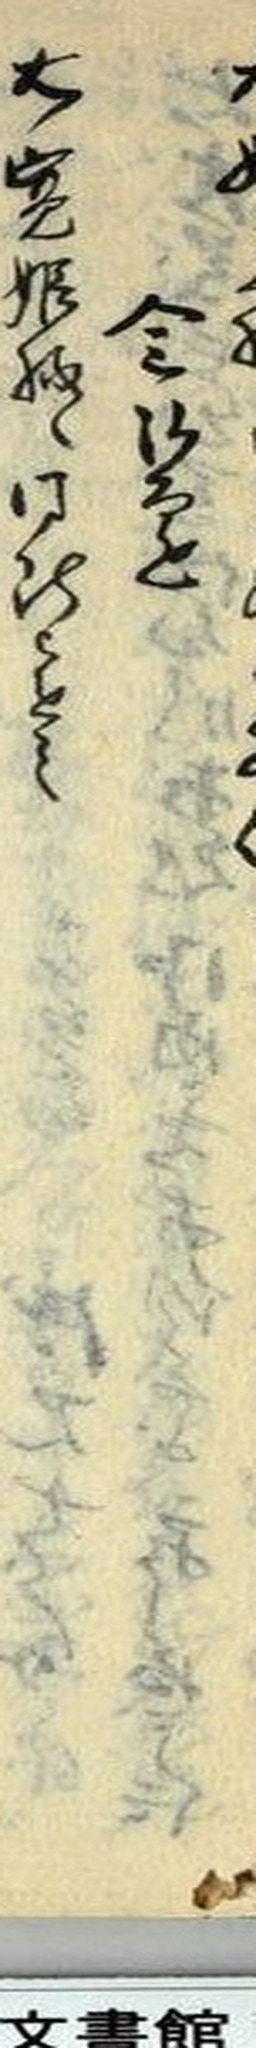右寛姫様へ同断被進之
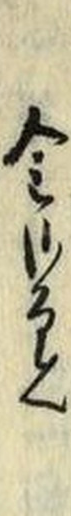金弐百疋
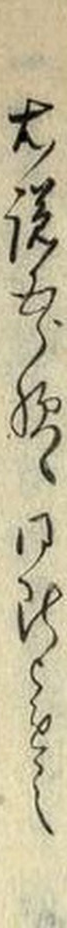右謙五郎様へ同断被進之
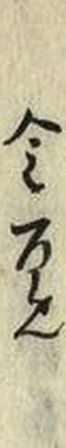金百疋
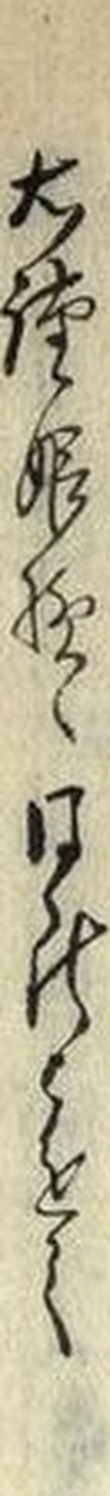右謹姫様へ同断被進之
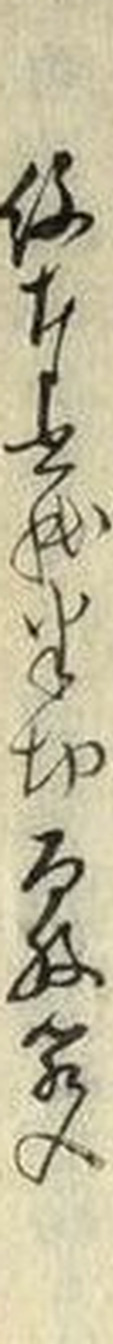紋奉書紙半切百枚箱入
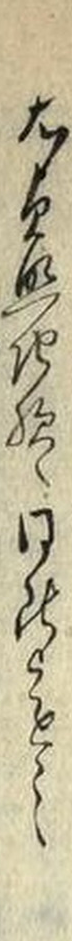右貞照院様へ同断被進之
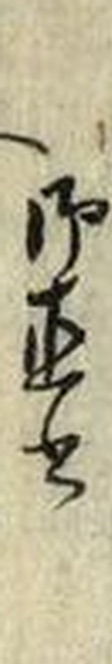御直書
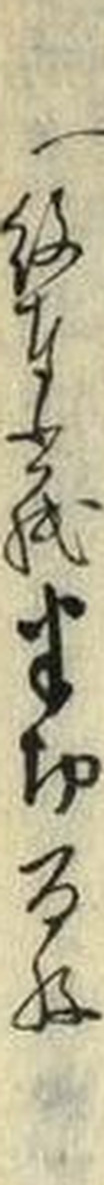紋奉書紙半切百枚
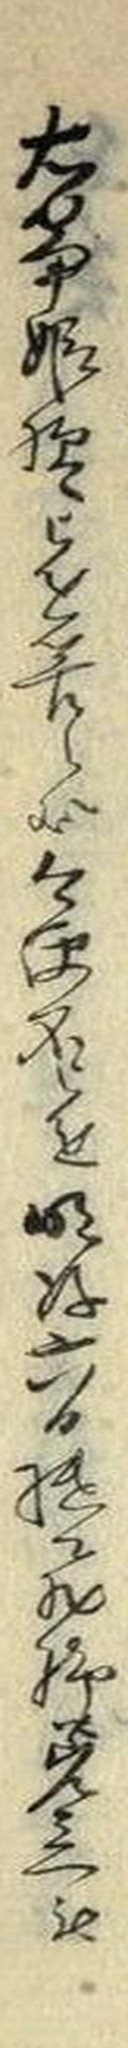右箏姫様へ被進筈之処今便不被進明後六日継飛脚差立被

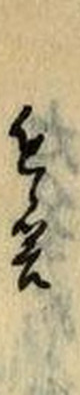進候筈
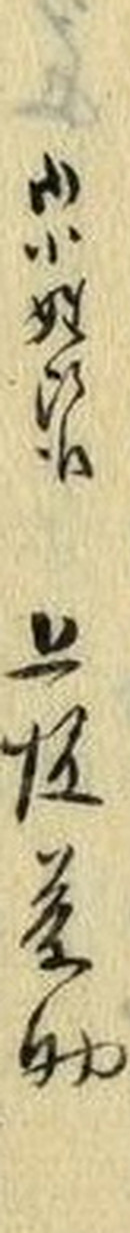御小姓頭取上坂藤助
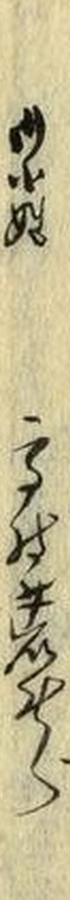御小姓高村荒次郎
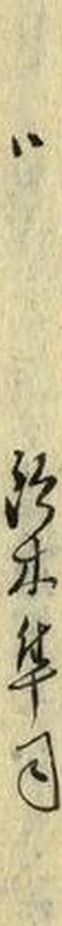同鈴木隼司
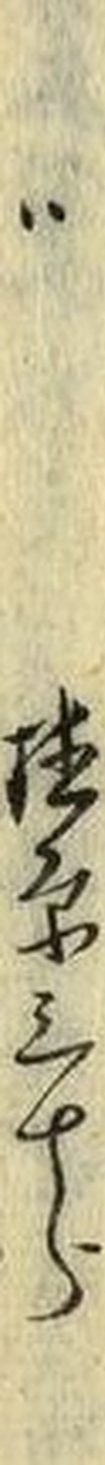同埴原三十郎
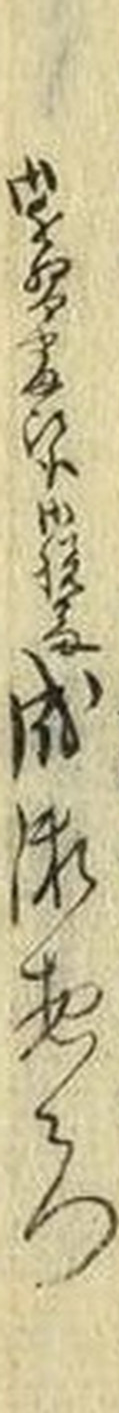御近習番頭取御膳番成瀬惣右衛門
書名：少傅日録抄（斉承付側向頭取日記、在国）
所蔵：福井県文書館 Fukui Prefectural Archives
